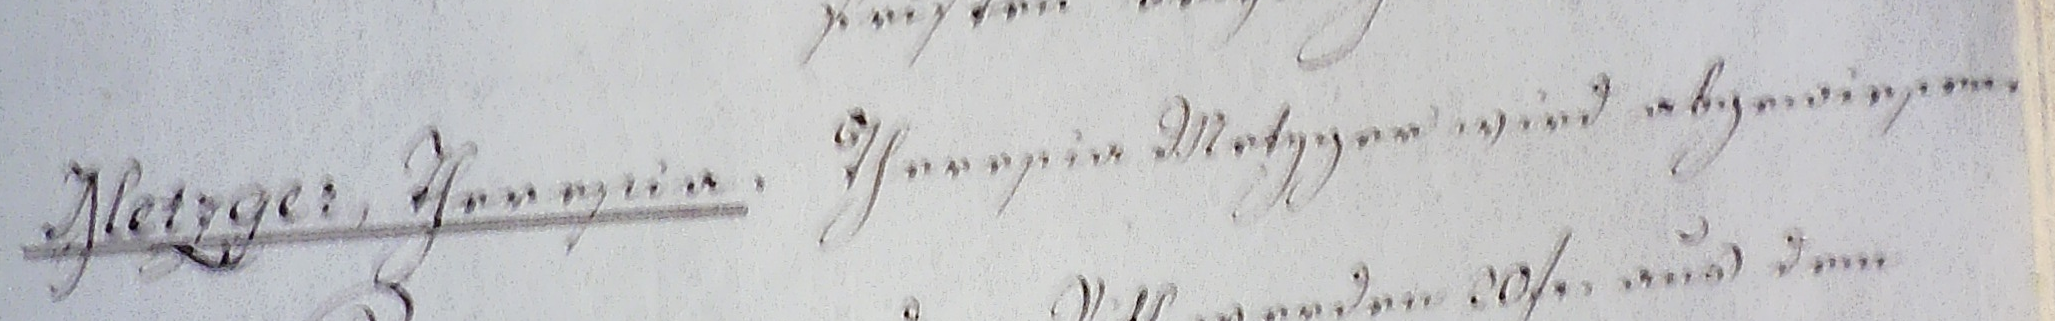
Metzger, Theresia. Theresia Metzger wird abgewiesen.
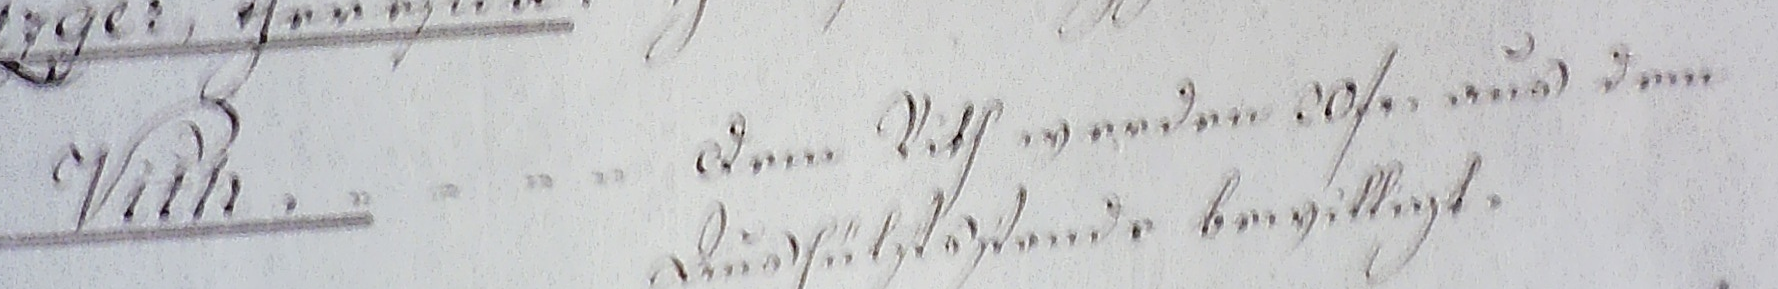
Vith. .. .. .. .. Dem Vith, werden 20fr. aus dem
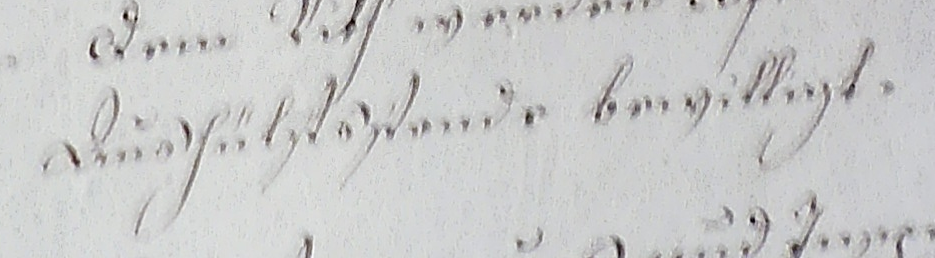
Aushülfsfonde bewilligt.
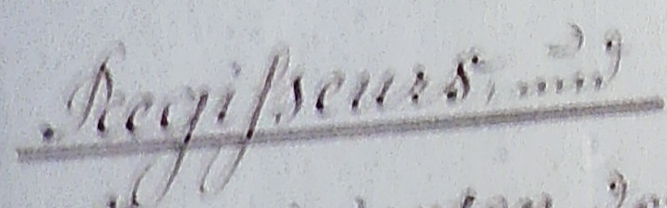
Regisseurs und
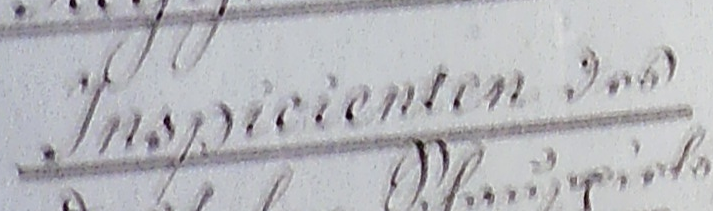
Inspicienten des
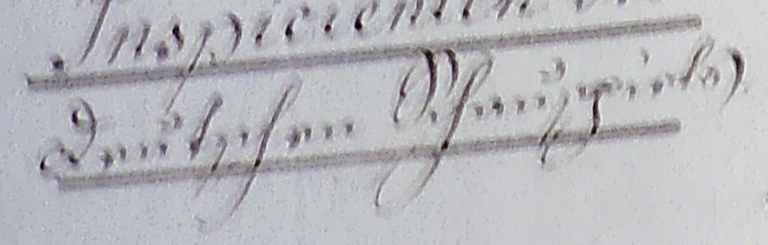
Deutschen Schauspiels
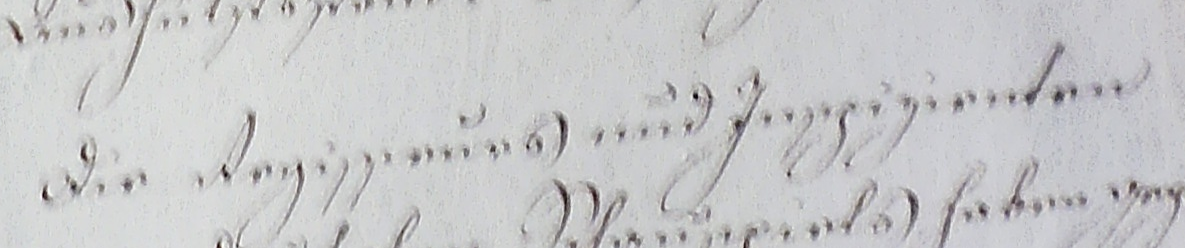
Die Regisseurs und Inspizienten
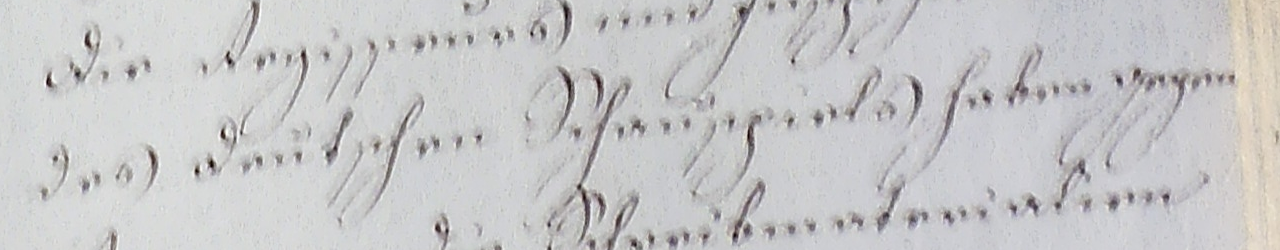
de Deutschen Schauspiels haben gegen
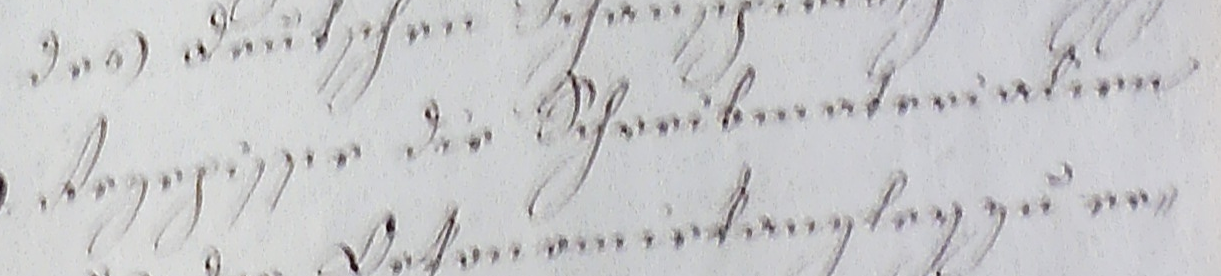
Rezepisse die Schreibmaterialien
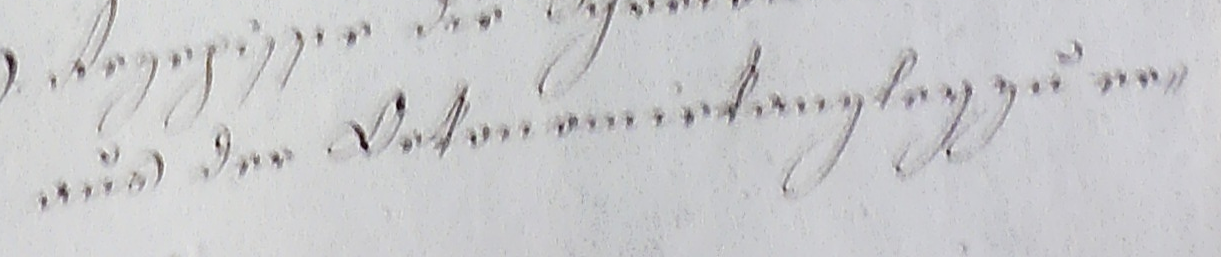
aus der Oekonomiekanzley zu er¬
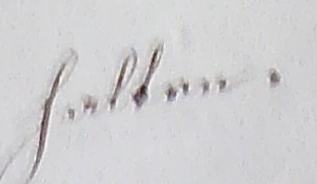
halten.
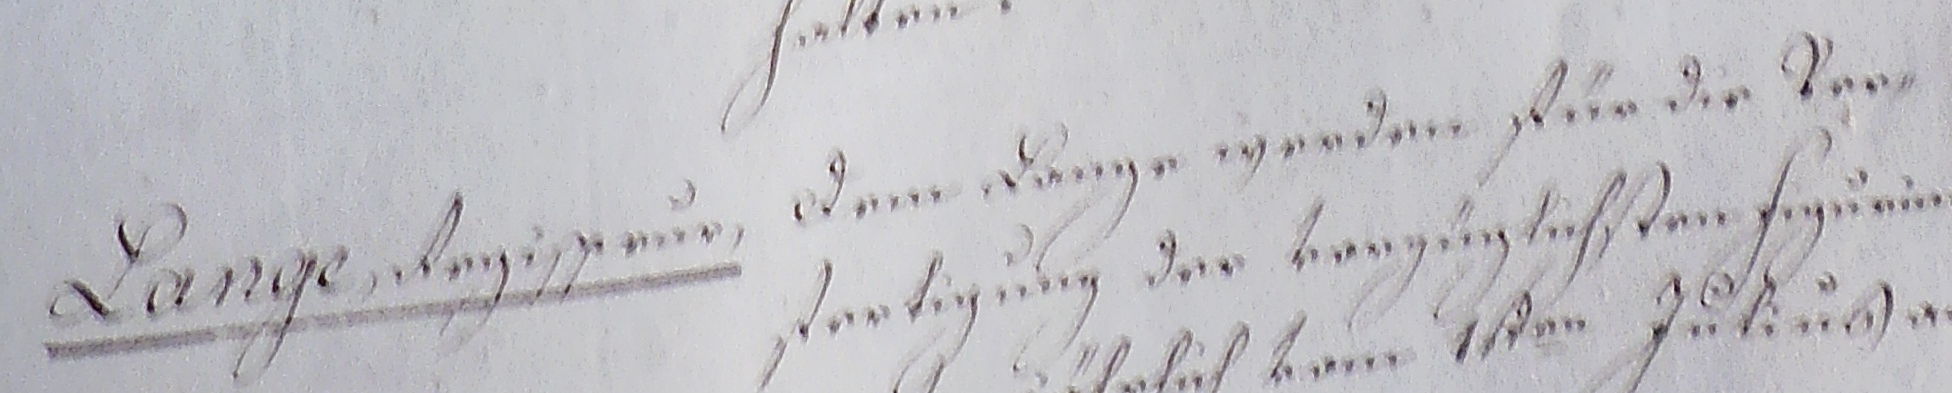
Lange, Regisseur, Dem Lange werden für die Ver¬
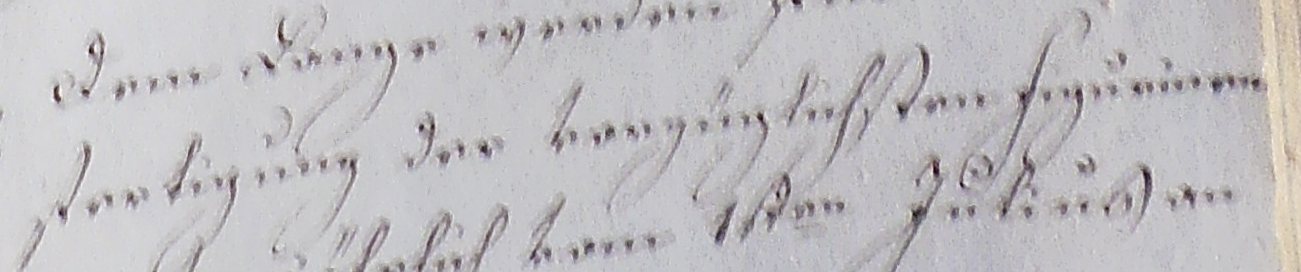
fertigung der vorzüglichsten Figurinen
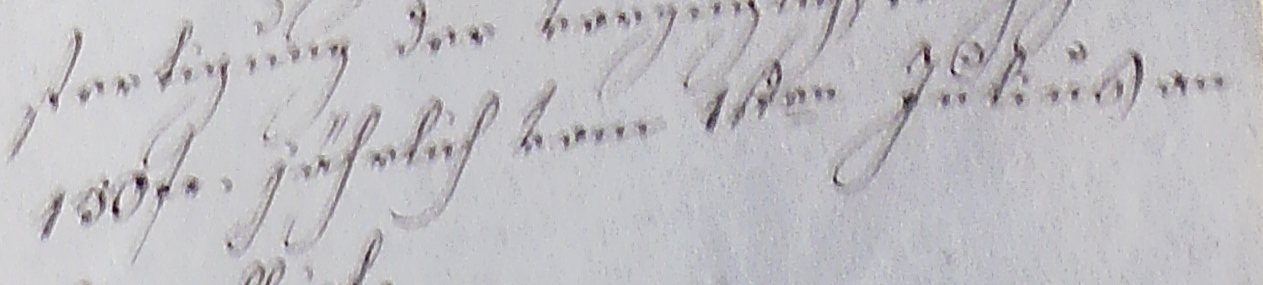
130fr. jährlich vom 1ste͇n Julius an
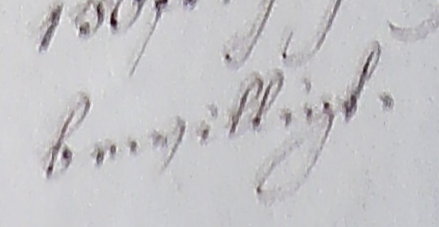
bewilligt.
